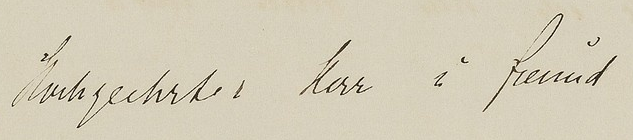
Hochgeehrter Herr u Freund
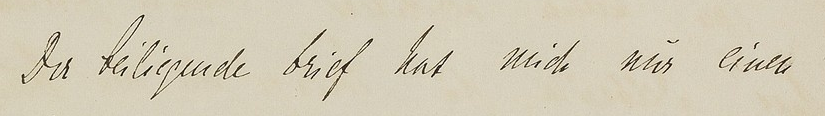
Der beiliegende Brief hat mich nur einen
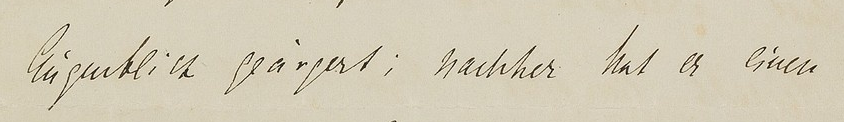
Augenblick geärgert; nachher hat er einen
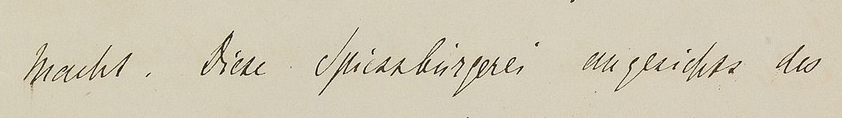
macht. Diese Spiessbürgerei angesichts des
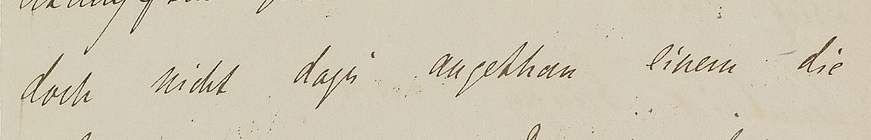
doch nicht dazu angethan einem die
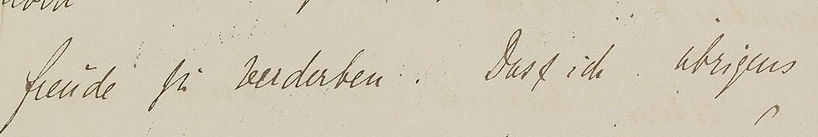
Freude zu verderben. Dass ich übrigens
